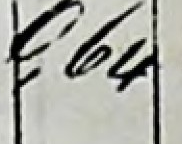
064
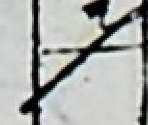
7
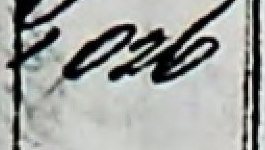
0,026
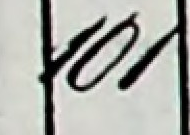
101
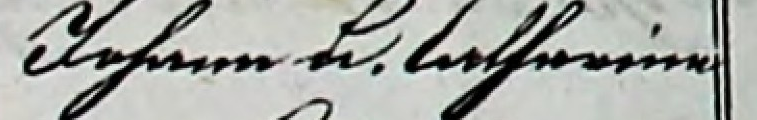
Johann u. Catharine
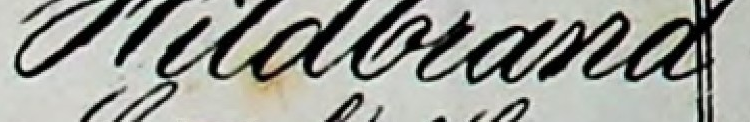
Hildbrand
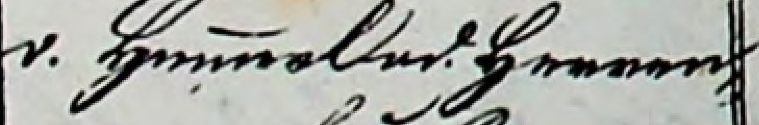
v. Hammerl ed. Herren„
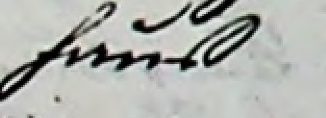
haus
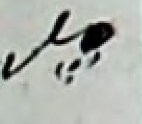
do
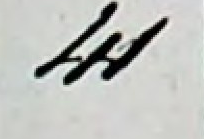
41
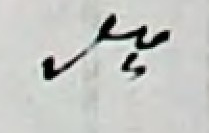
do
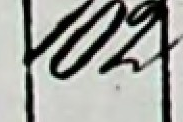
102
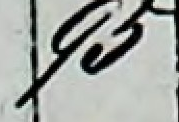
95
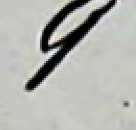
9
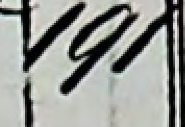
191
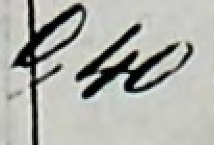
0,40
